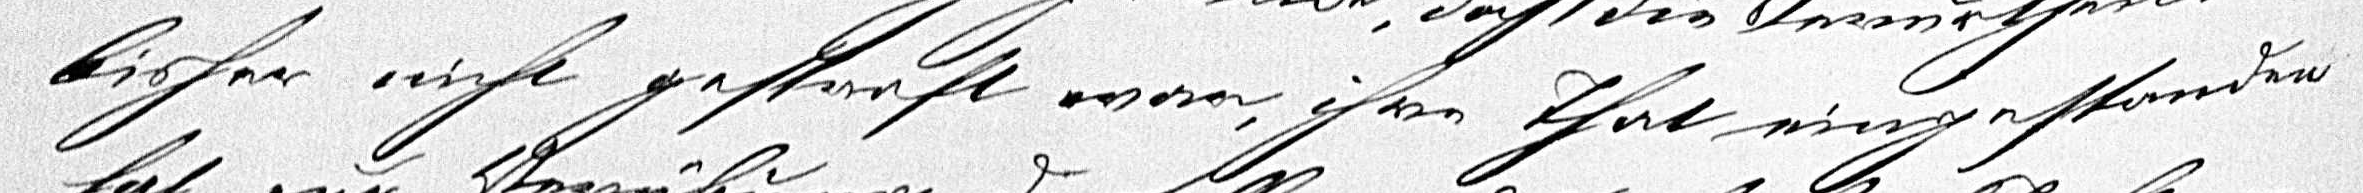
bisher nicht gestraft war, ihre That eingestanden
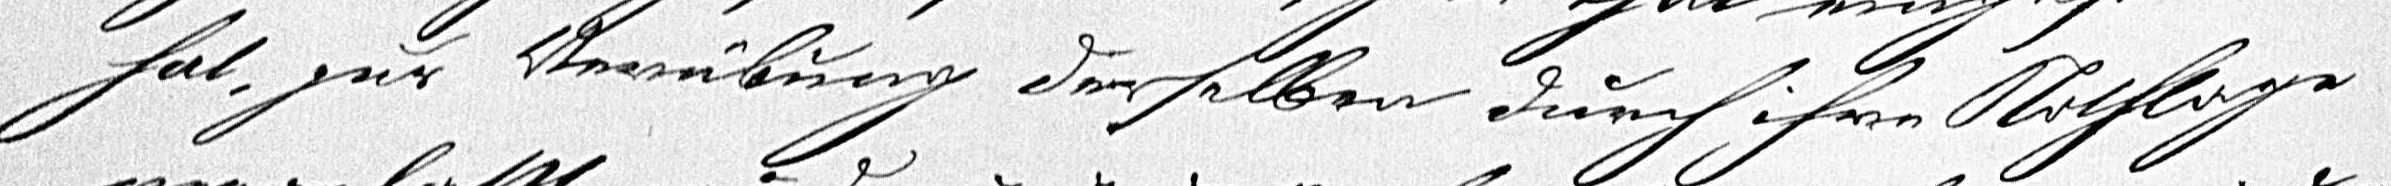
hat, zur Verübung derselben durch ihre Nothlage
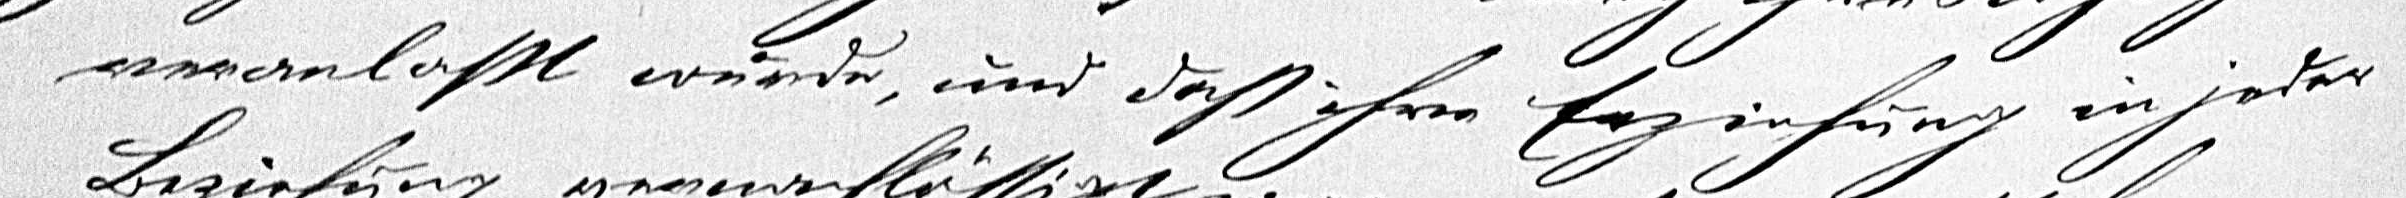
veranlaßt wurde, und daß ihren Erziehung in jeder
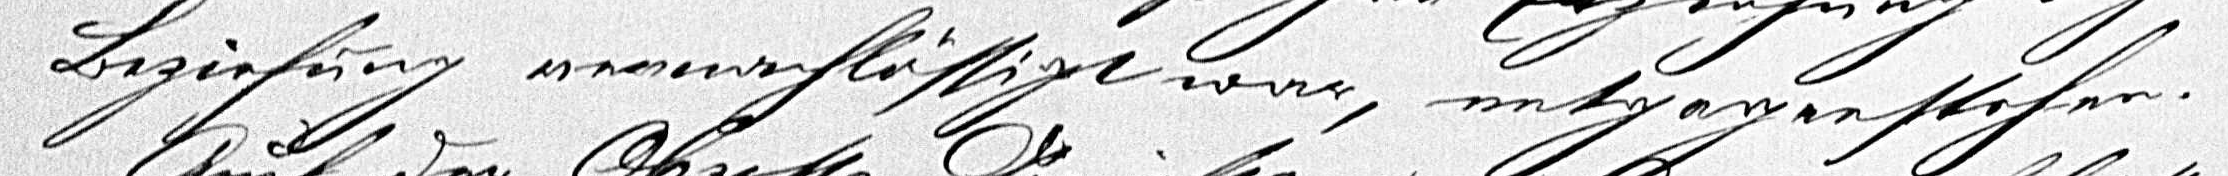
Beziehung vernachlässigt war, entgegenstehen.
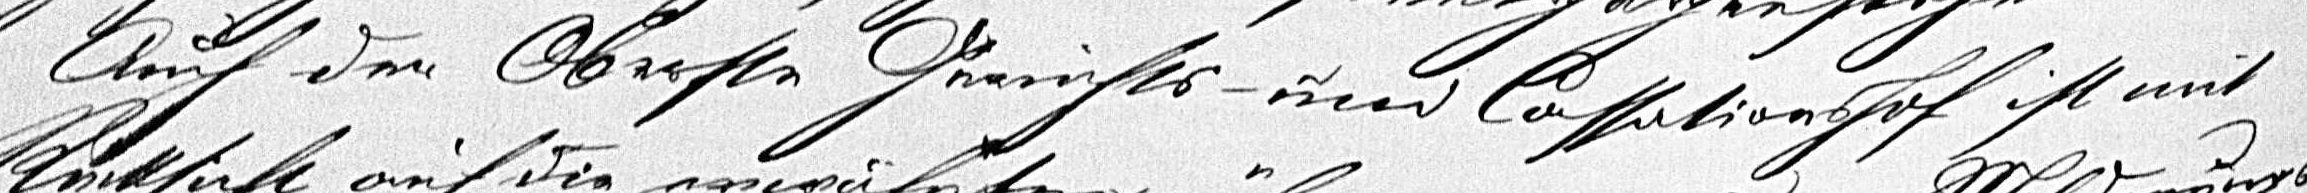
Auch der Oberste Gerichts- und Cassationshof ist mit
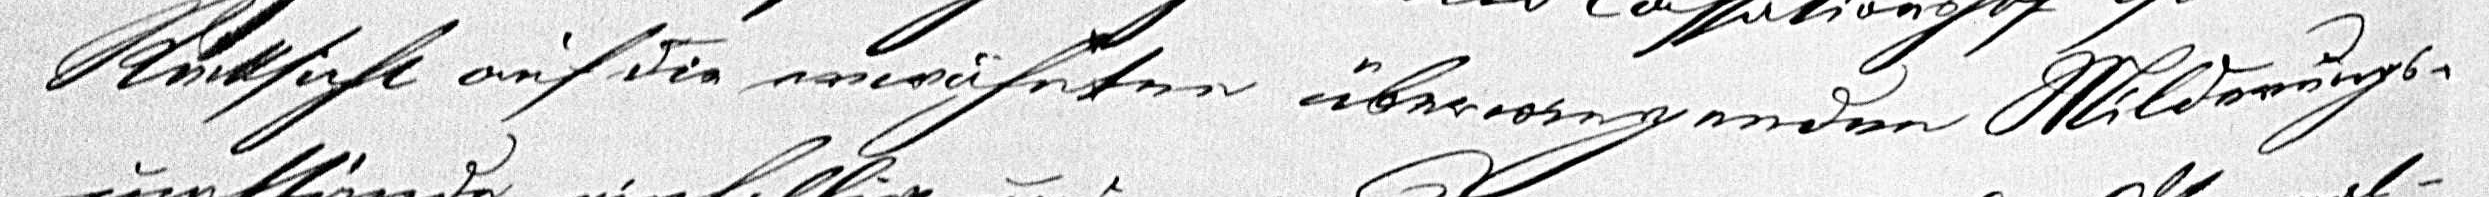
Rücksicht auf die erwähnten überwiegenden Milderungs¬
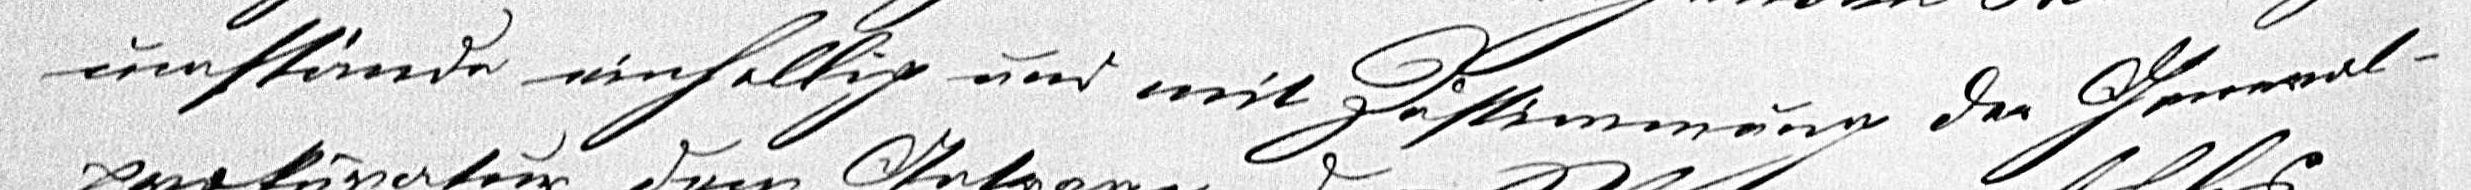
umstände einhellig und mit Zustimmung der General¬
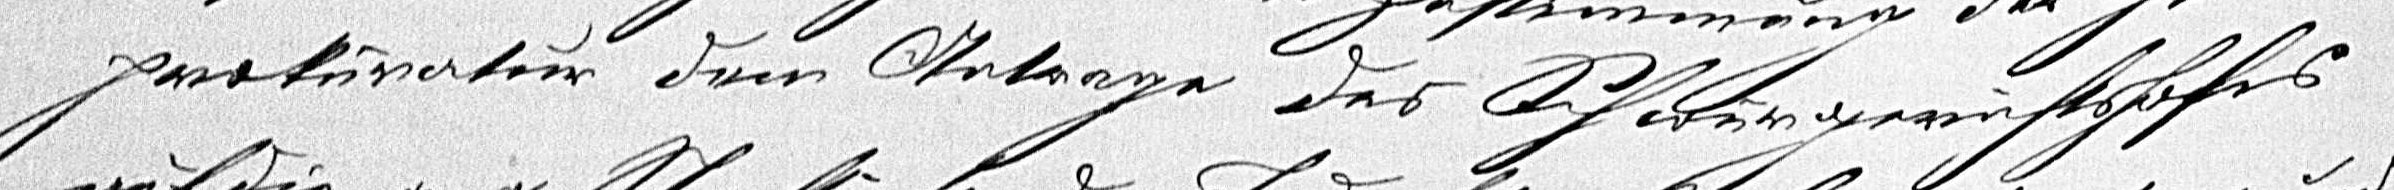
prokuratur dem Antrage des Schwurgerichtshofes
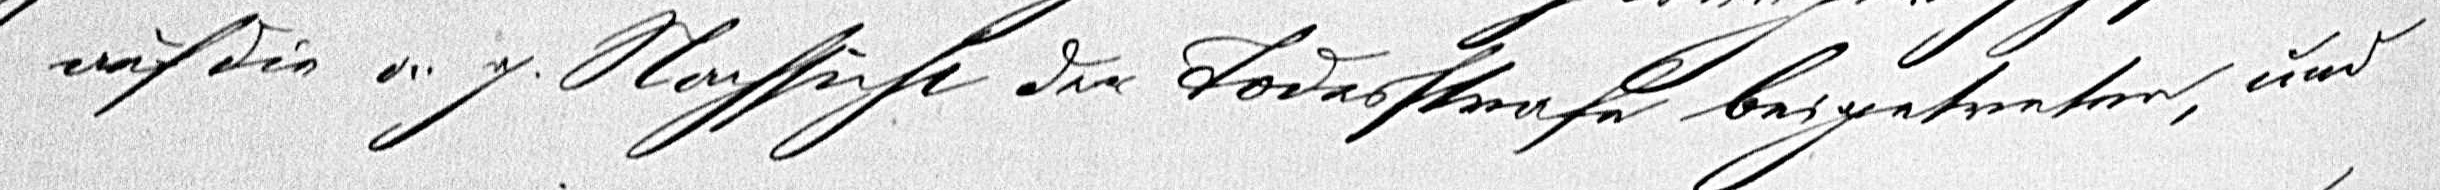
auf die a. g. Nachsicht der Todesstrafe beigetreten, und
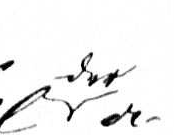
der
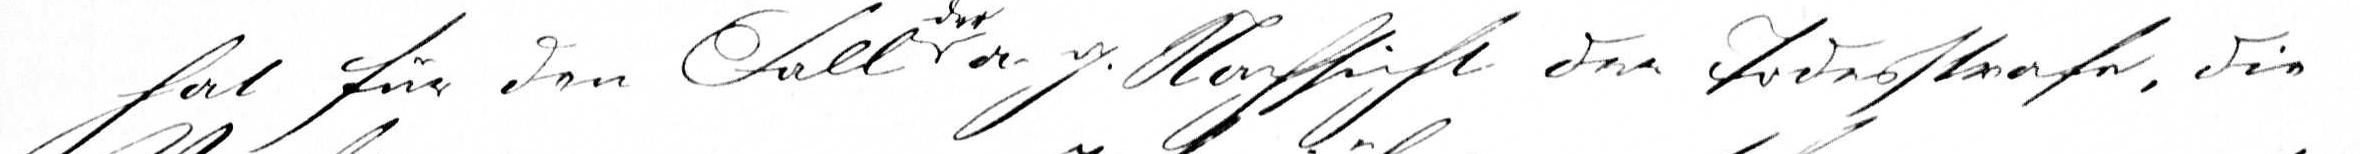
hat für den Fall a. g. Nachsicht der Todesstrafe, die
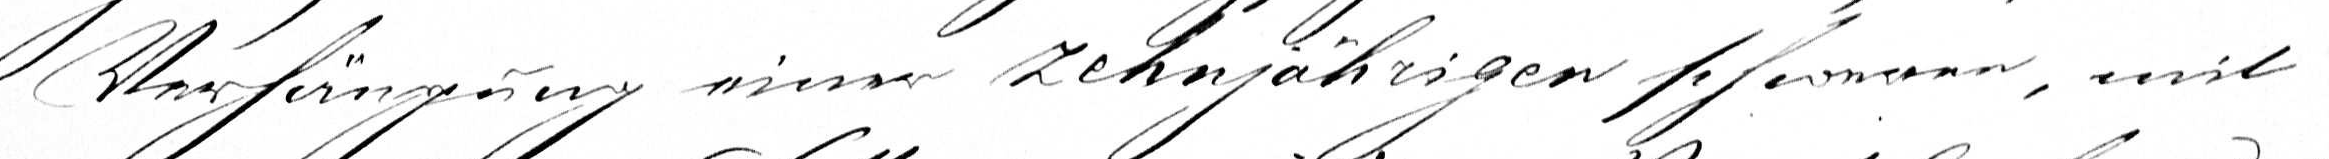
Verhängung einer zehnjährigen schweren, mit
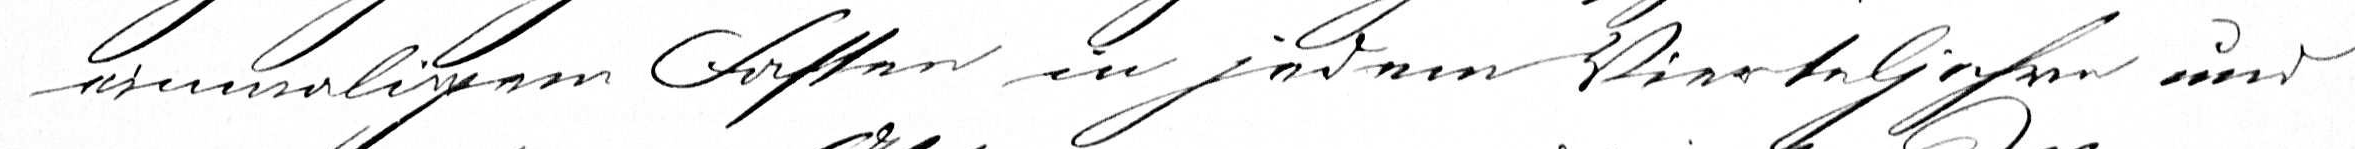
einmaligem Fasten in jedem Vierteljahre und
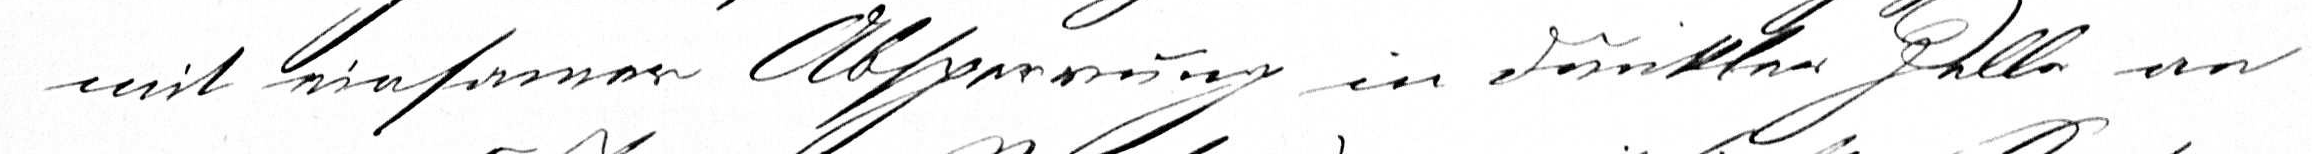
mit einsamer Absperrung in dunkler Zelle an
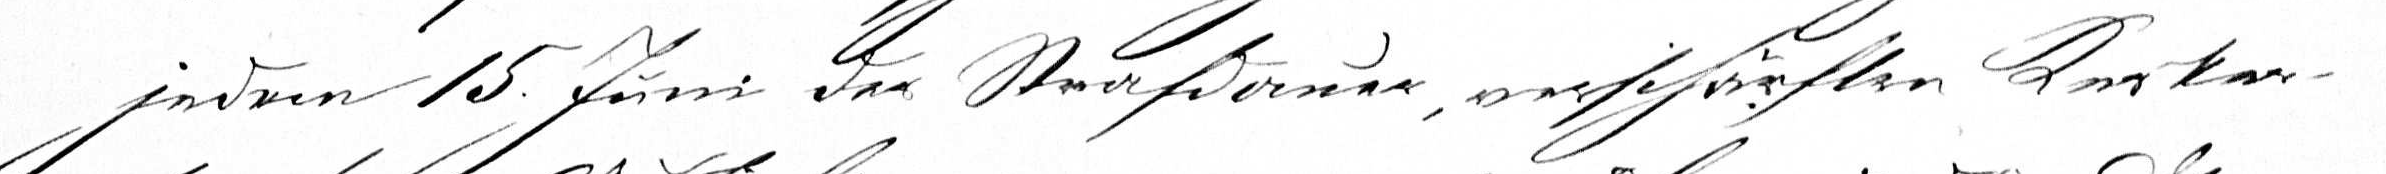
jedem 15. Juni der Strafdauer, verschärften Kerker¬
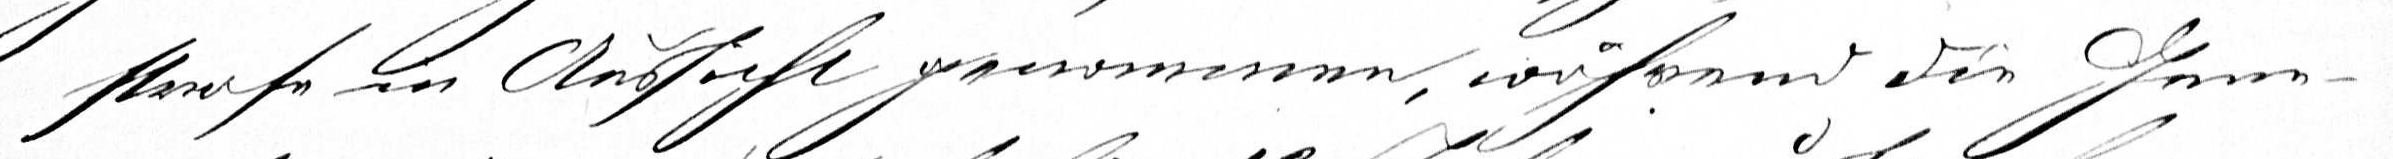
strafe in Aussicht genommen, während die Gene¬
